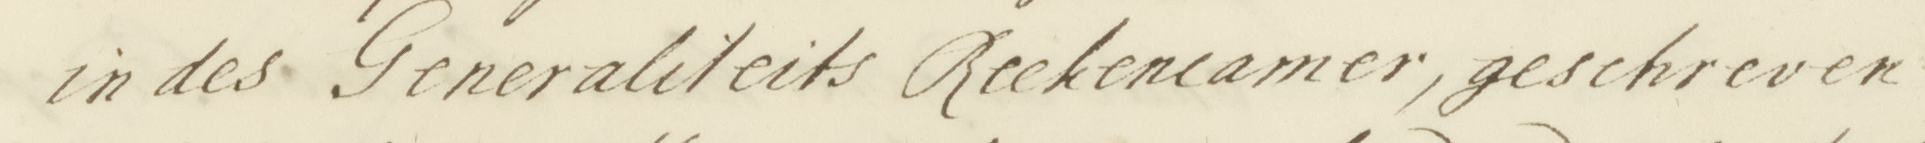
in des Generaliteits Reekenkamer, geschreven
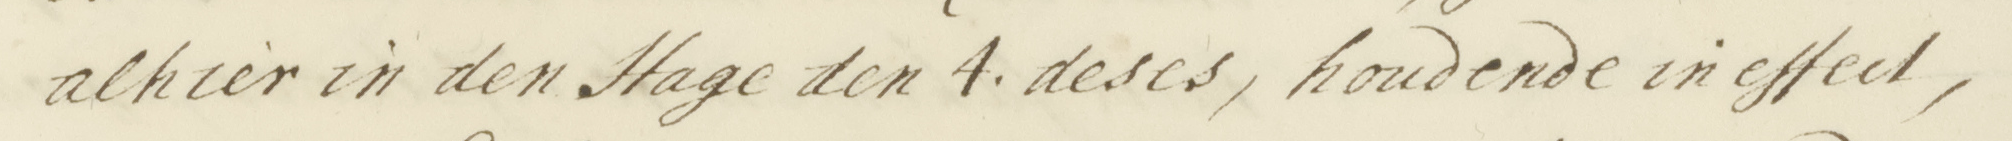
alhier in den Hage den 4. deses, houdende in effect,
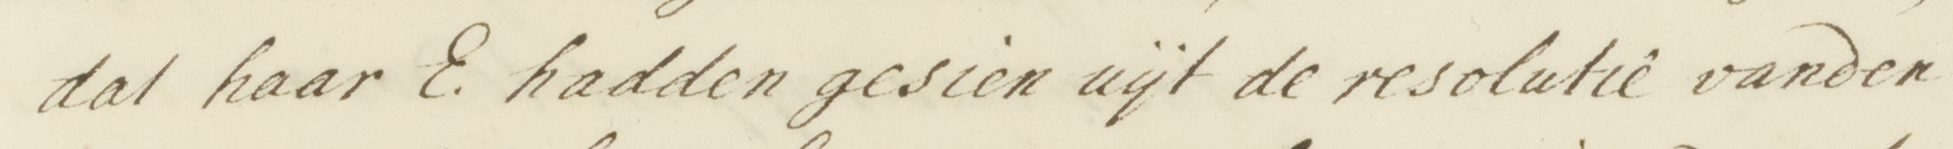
dat haar E. hadden gesien uijt de resolutie vanden
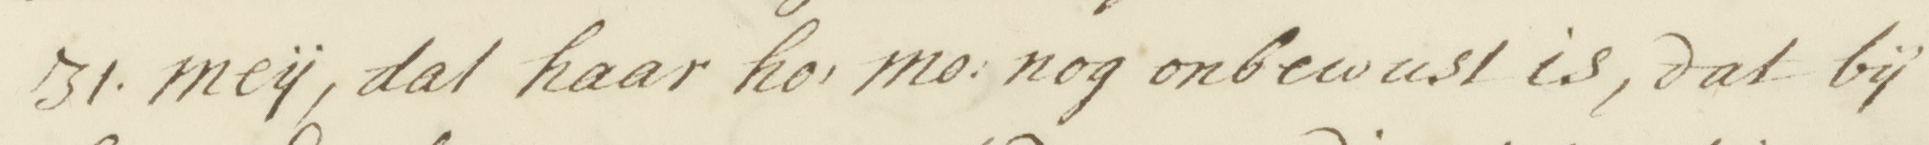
31. meij, dat haar ho:mo: nog onbewust is, dat bij
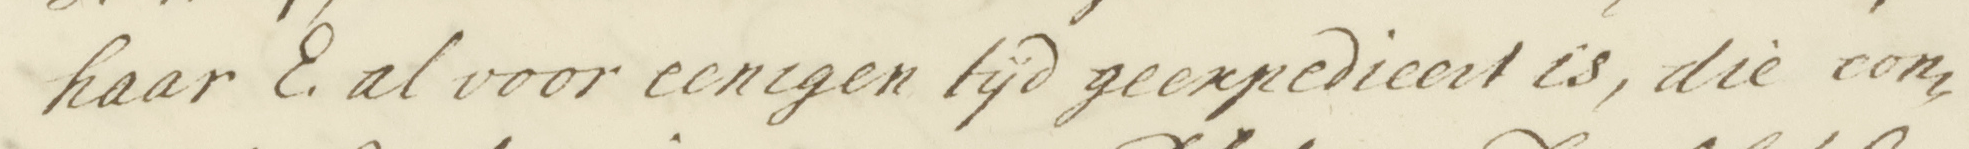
haar E. al voor eenigen tijd geexpedieert is, die con„
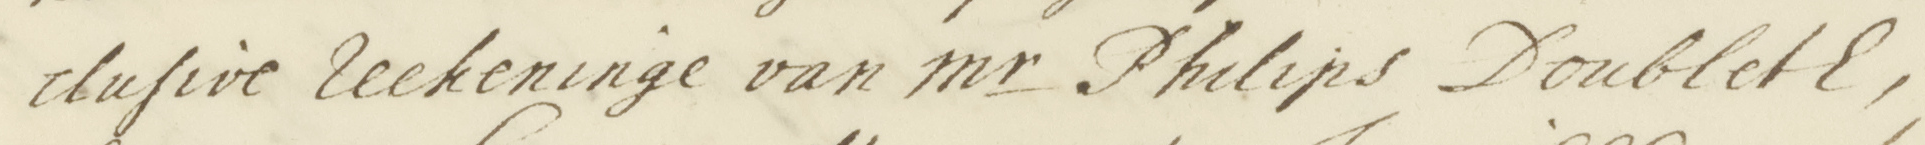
clusive reekeninge van mr Philips Doubleth,
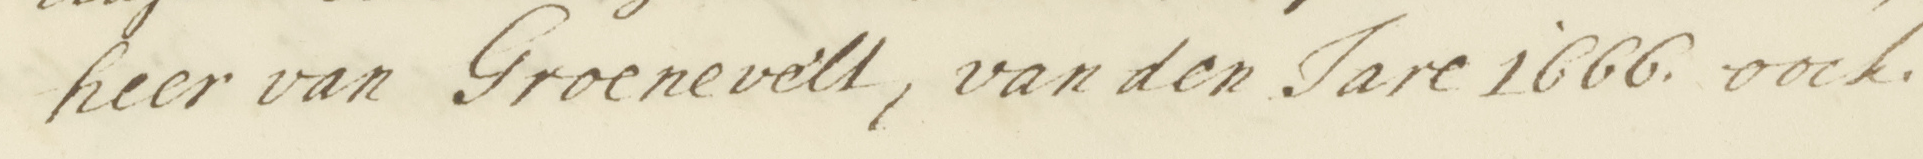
heer van Groenevelt, van den Jare 1666. oock
